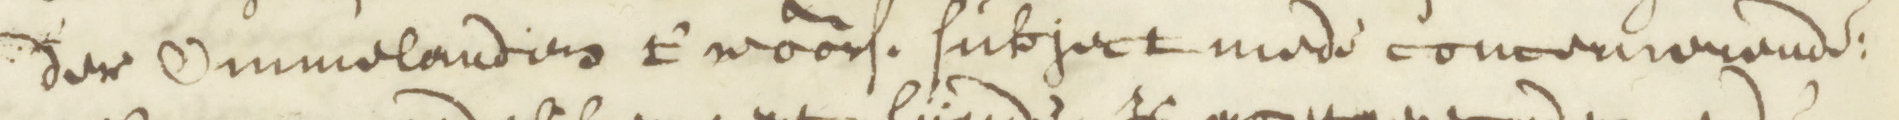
der Ommelanden t' voors. subject mede concernerende:
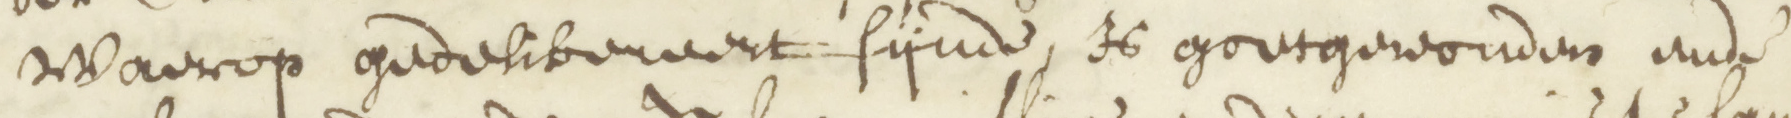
Waerop gedelibereert sijnde, Is goetgevonden ende
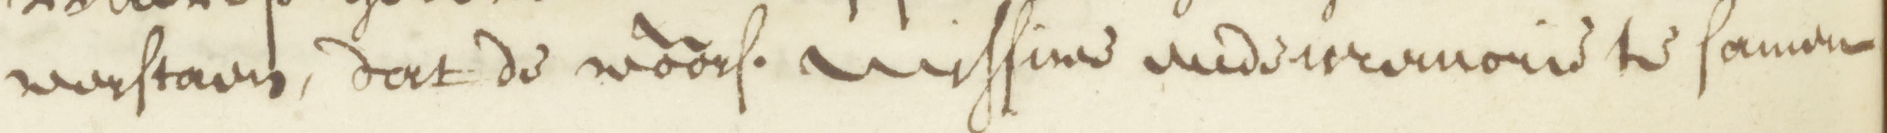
verstaen, dat de voors. missive ende memorie te samen
